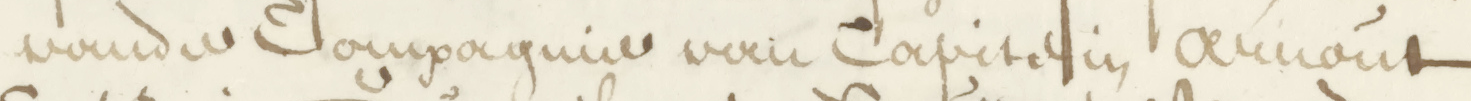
vande Compagnie van Capitein Arnout
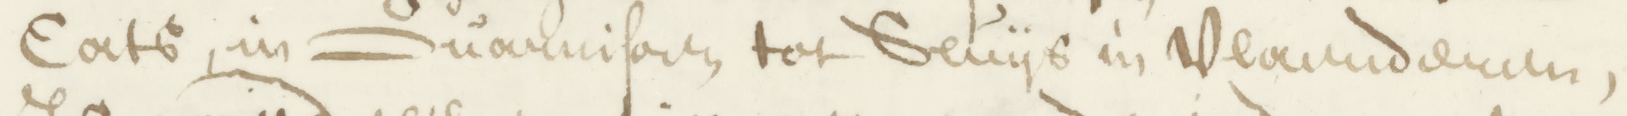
Cats, in Guarnisoen tot Sluijs in Vlaenderen,
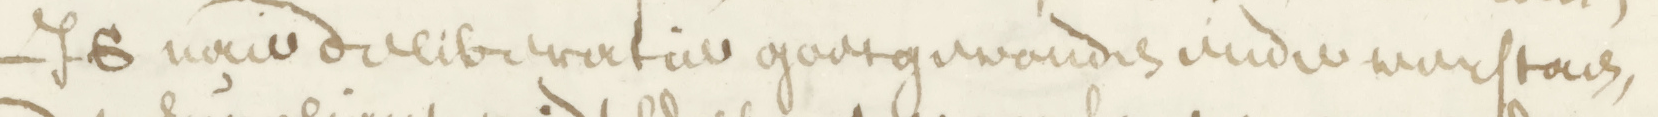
— Is nae deliberatie goetgevonden ende verstaen,
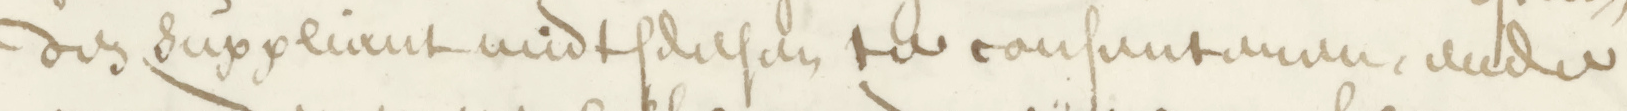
den Suppliant midtsdesen te consenteren, ende
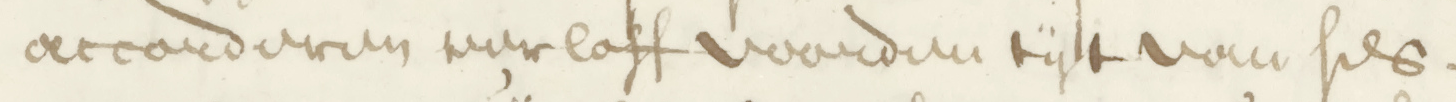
accorderen verloff voor den tijt van ses
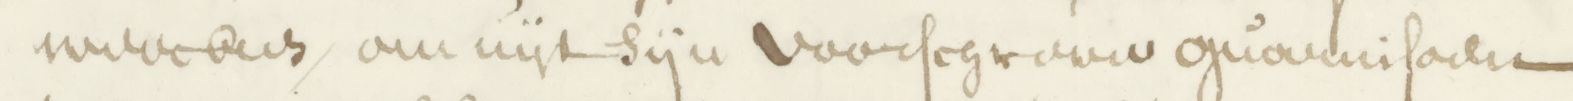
weecken, om uijt sijn voorschreve Guarnisoen
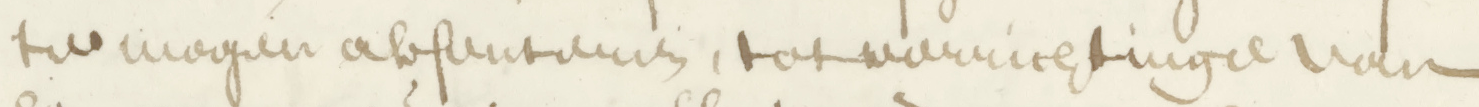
te mogen absenteren, tot verrichtinge van
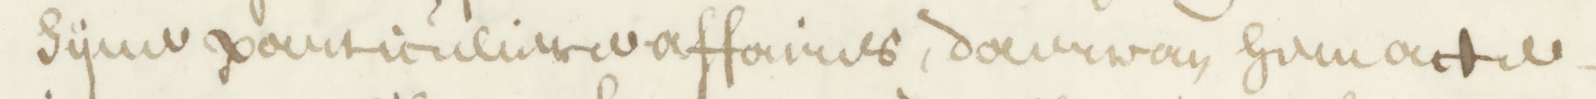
sijne particuliere affaires, daervan hem acte
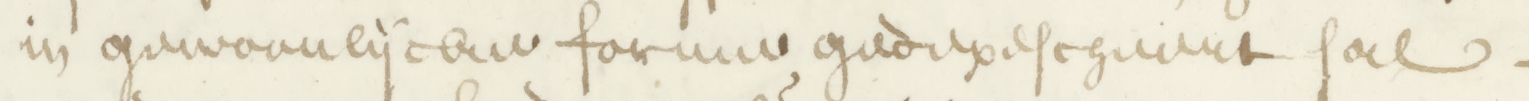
in gewoonlijcke forme gedepescheert sal -
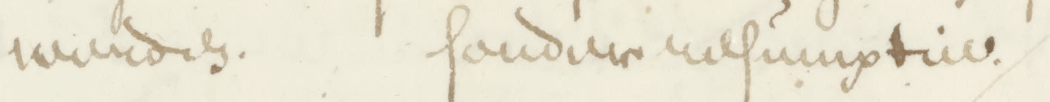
werden. sonder resumptie.
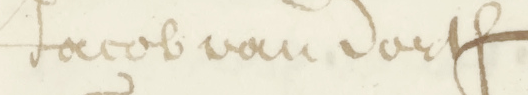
Jacob van Dorth
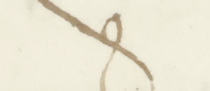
ca.
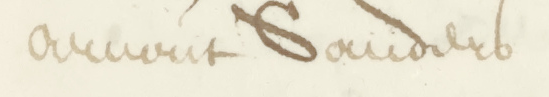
Arnout Sanders
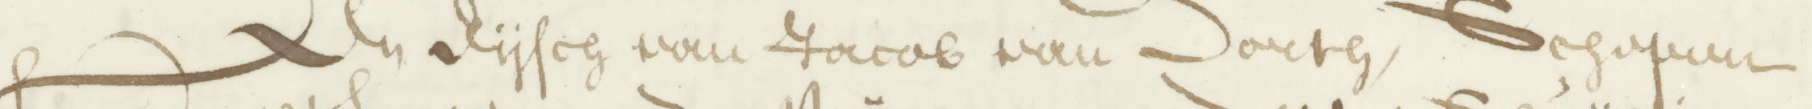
Den Eijsch van Jacob van Dorth, Schepen
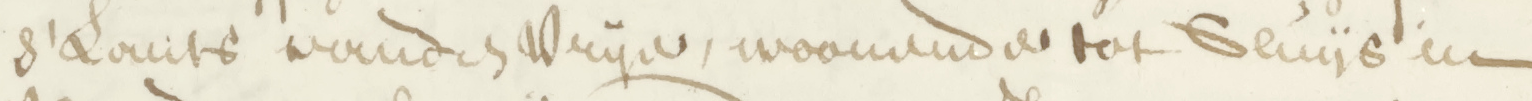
s‛Lants vanden Vrije, woonende tot Sluijs in
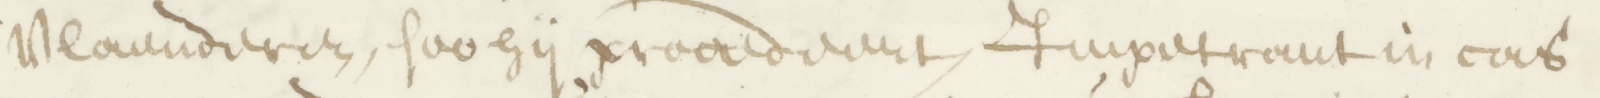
Vlaenderen, soo hij procedeert, Impetrant in cas
